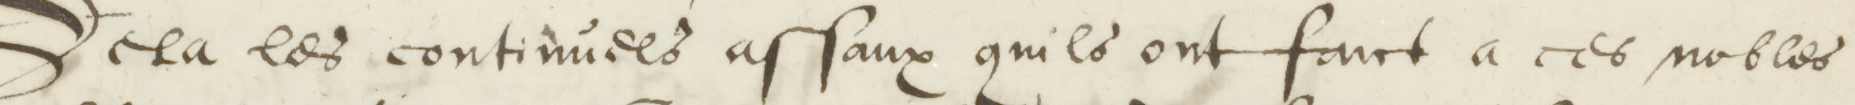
Dela les continuels assaux quils ont faict a ces nobles
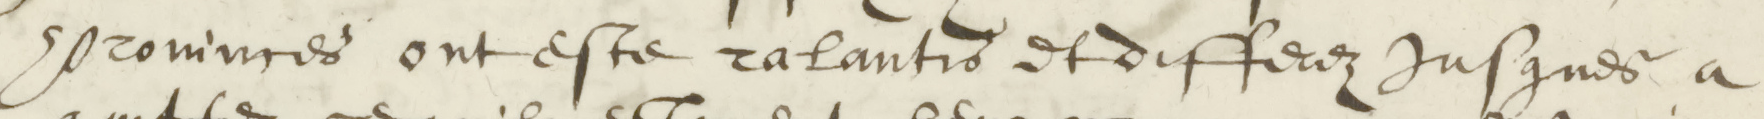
Prouinces ont este ralantis et differez jusques a
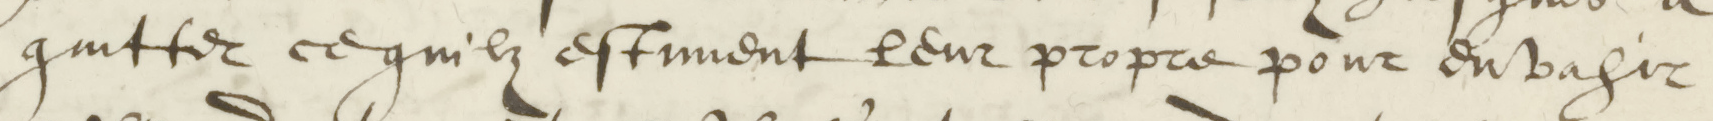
quitter ce quilz estiment leur propre pour envahir
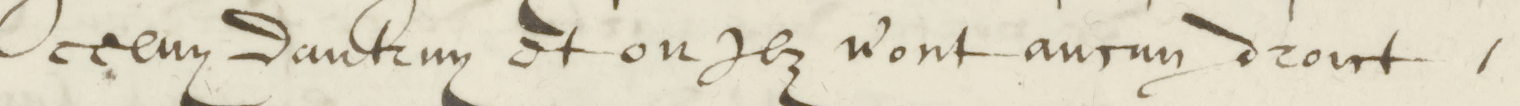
celuy dantruy et ou ilz n‛ont aucun droict
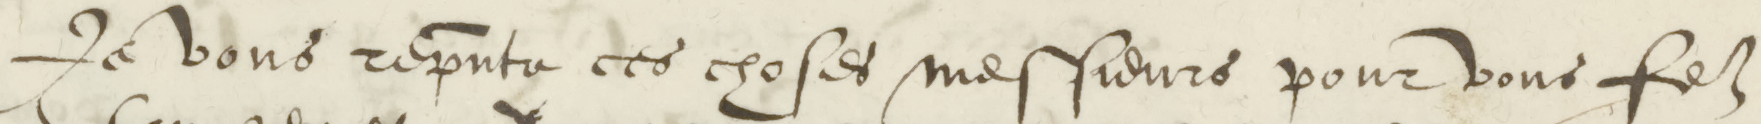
Je vous repnte ces choses messieurs pour vous fez
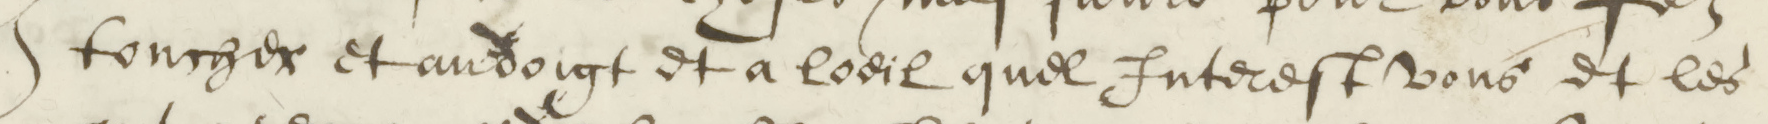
toucher et au doigt et a loeil quel Interest vous et les
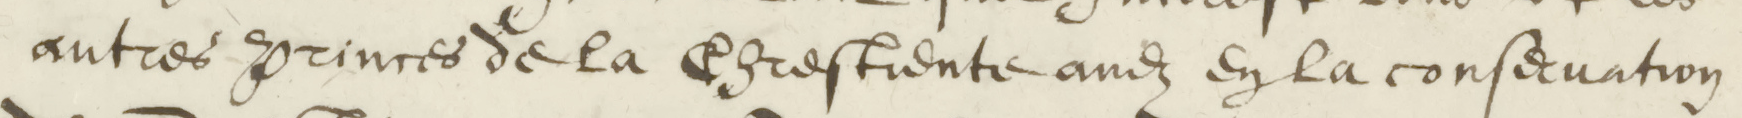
autres Princes de la Chrestiente auez en la conseruation
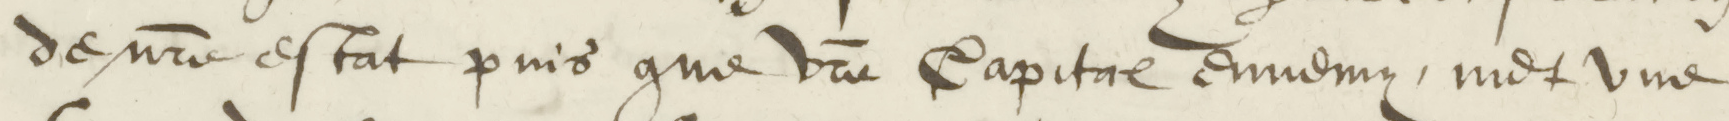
de nre estat puis que vre Capital ennemy, met vue
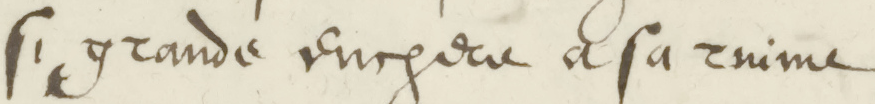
si grande enchere a sa ruine
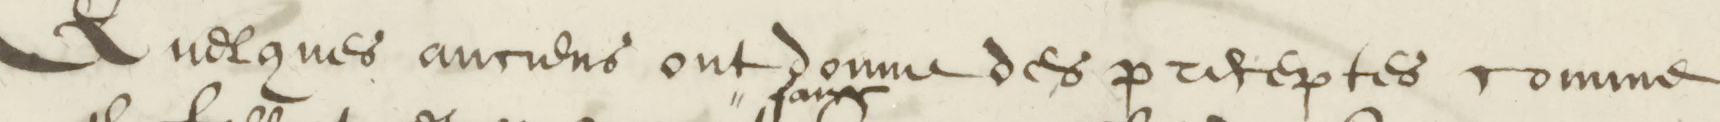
Quelques anciens ont donne des preceptes comme
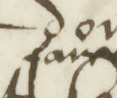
”faire
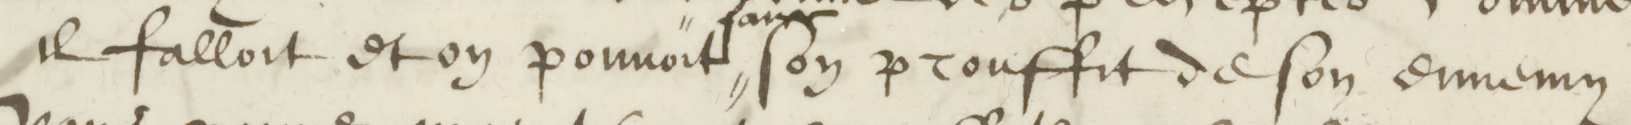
il falloit et on pouuoit„ son prouffit de son ennemy
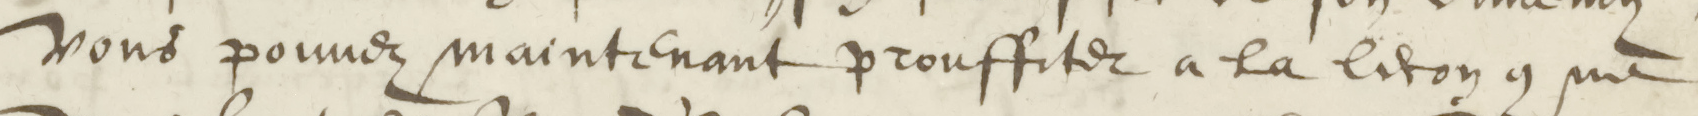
vous pouuez maintenant prouffiter a la lecon que
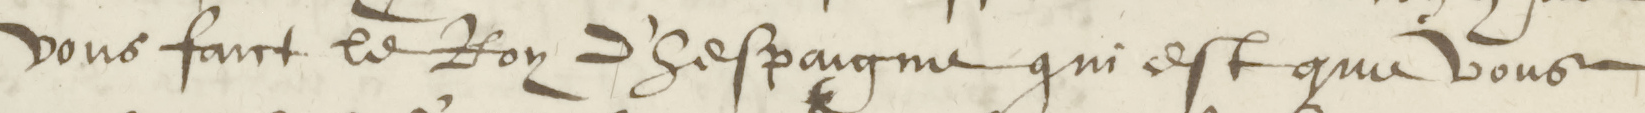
vous faict le Roy d'hespaigne qui est que vous
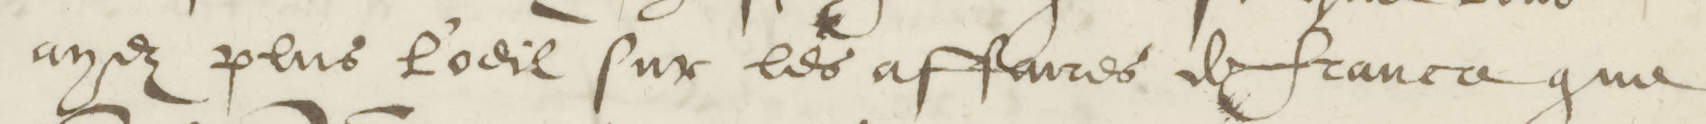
ayez plus l‛oeil sur les affaires de France que
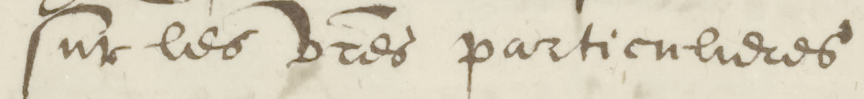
sur les vres particulieres.
